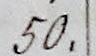50
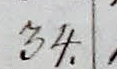34.
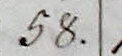58.
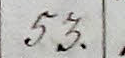53.
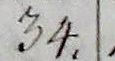34.
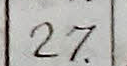27.
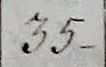35
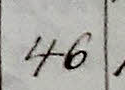46
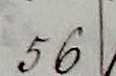56
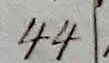44
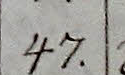47.
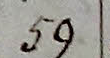59
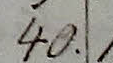40.
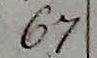67
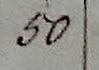50
